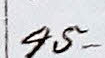45
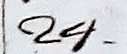24
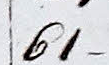61
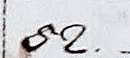52.
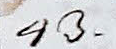43
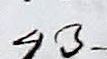43
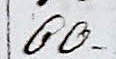60
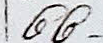66
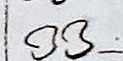33
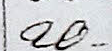20
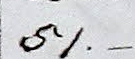51.
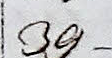39
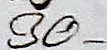30
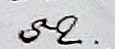52
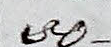50
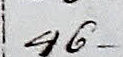46
